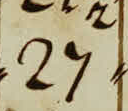27
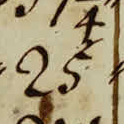25
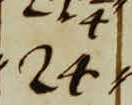24
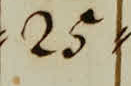25
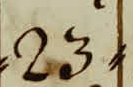23
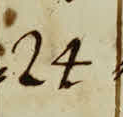24
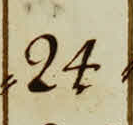24
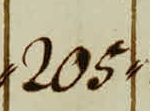205
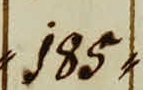185
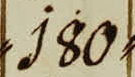180
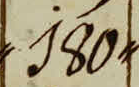180
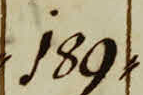189
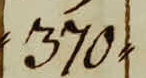370
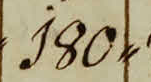180
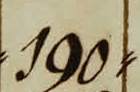190
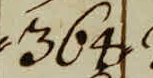364
